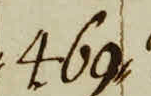469
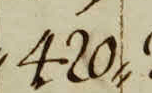420
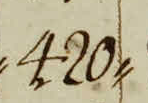420
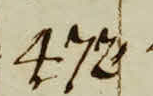472
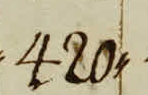420
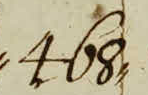468
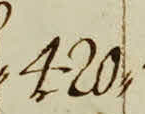420
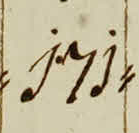171
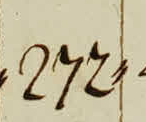272
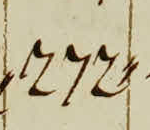272
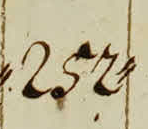252
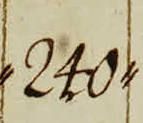240
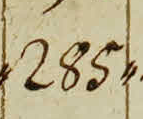285
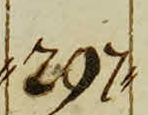297
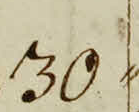30
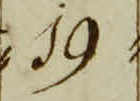19
